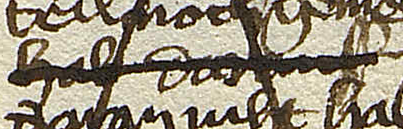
hab darauff
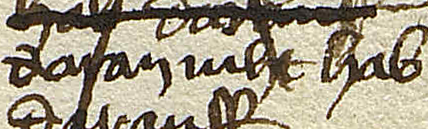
daran niht hab
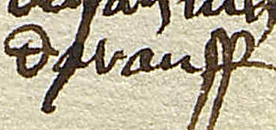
darauff
